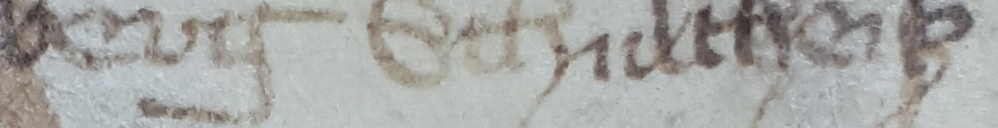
berg Schultheiſʒ
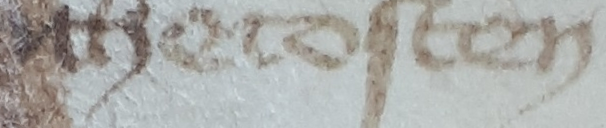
thecoſten
